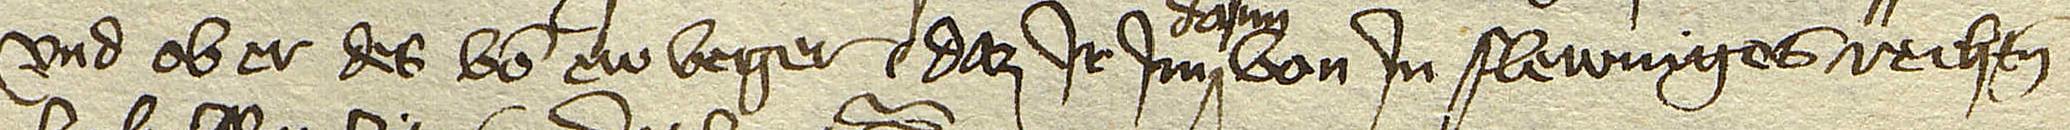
vnd ob er des vo* ew beger / daʒ Ir Im von In ſlewniges rechtn*
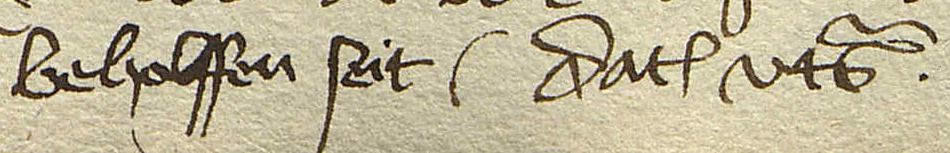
beholffen ſeit / Dat* vts* .
